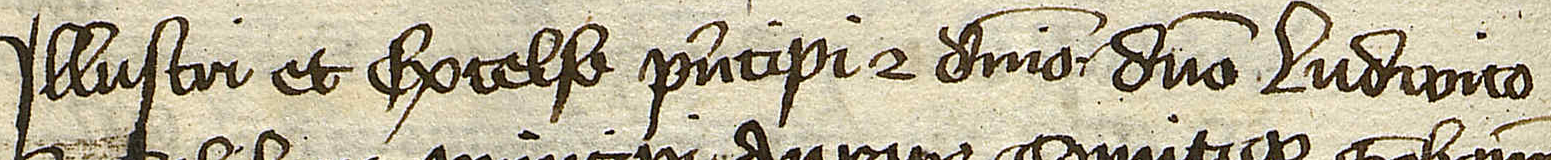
Illuſtri et Excelſo p*ncipi @ d*nio / d*no Ludwico
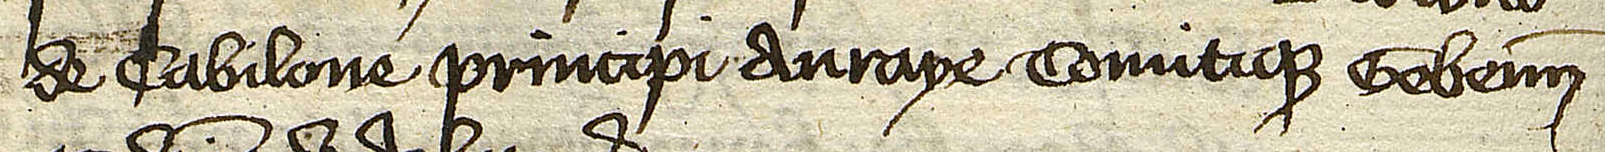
de Cabilone principi Auraye / Comitiq* Gebenn*
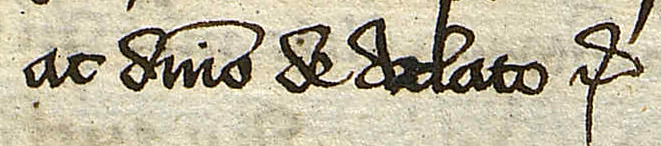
ac d*nio de Arelato §
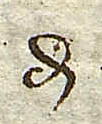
d*
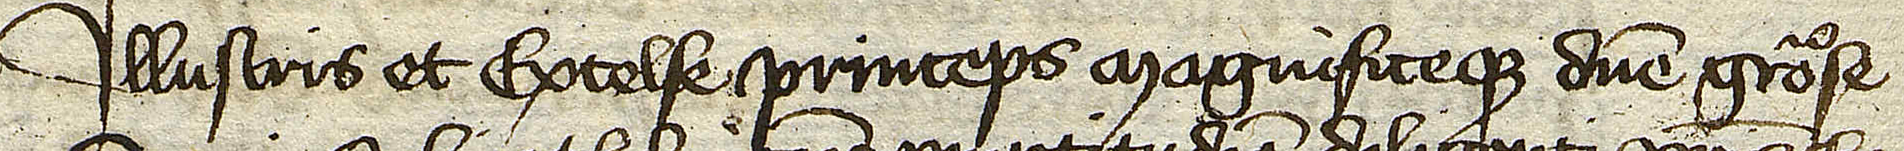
Illuſtris et Excelſe princeps Magnificeq* d*ne g*roſe
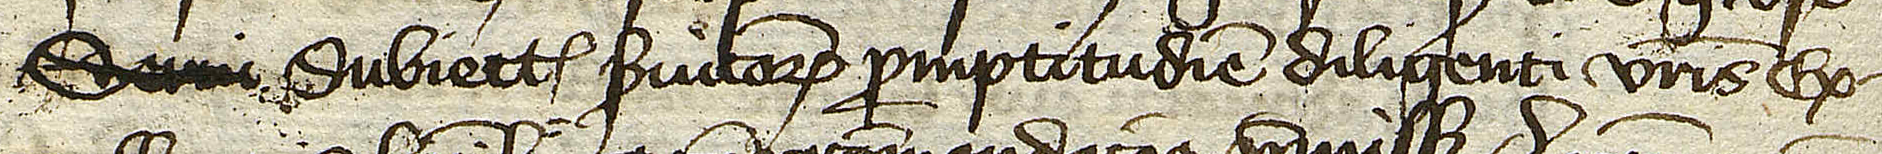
Serui Subiect* ſ*uico* p*mptitudi*e diligenti v*ris Ex-
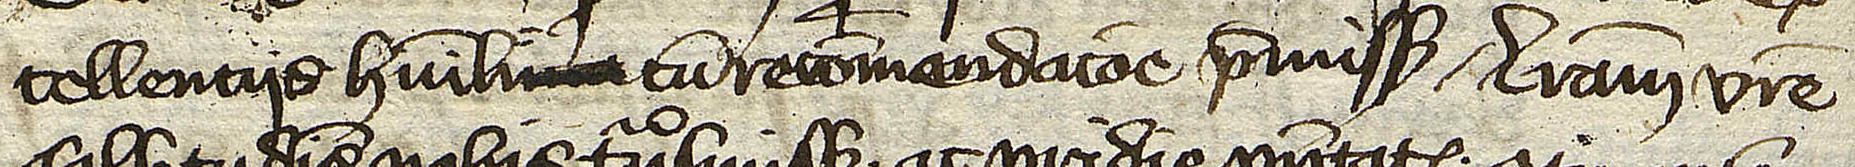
cellentiis hu*ilium cu* reco*mandac*o*e p*miſſ* / L*ram v*re
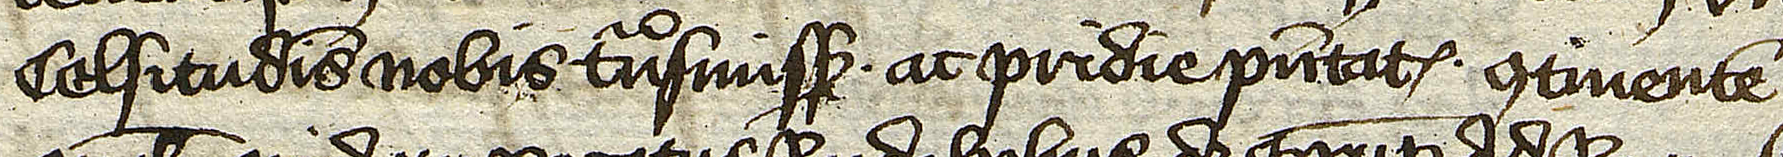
Celſitudi*s nobis t*nſmiſſ* . ac pridie p*ntat* . *tinente*
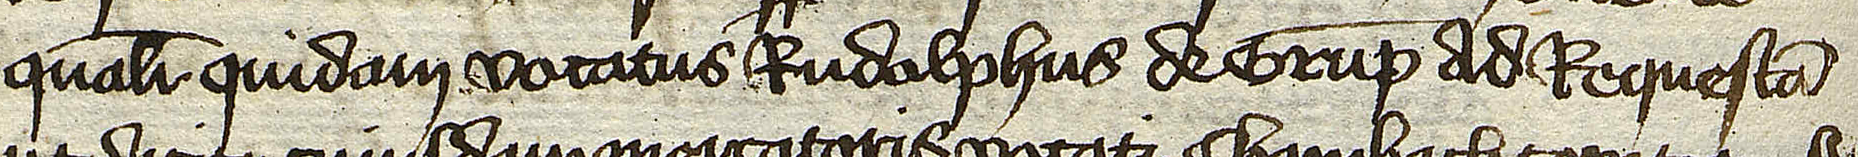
qual*r quidam vocatus Rudolphus de Grup Ad Requesta*
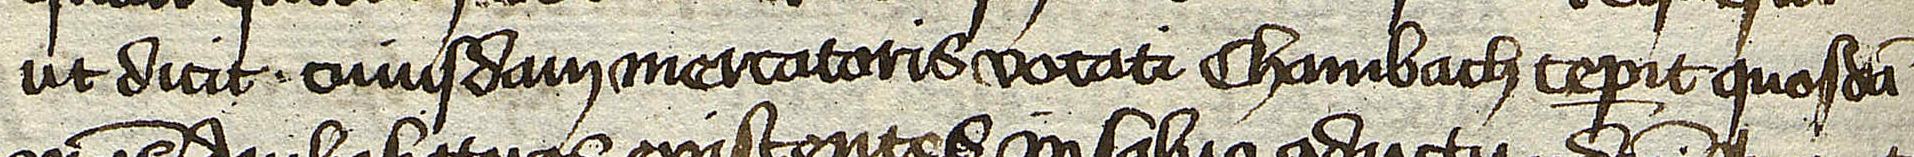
ut dicit . cuiuſdam mercatoris vocati Chambath cep*it quoſda*
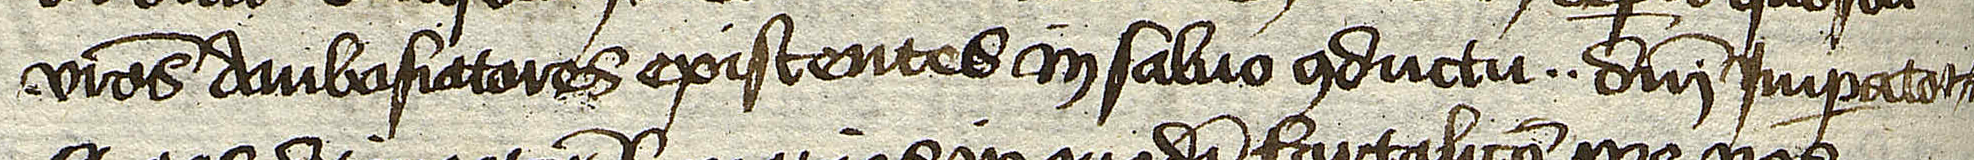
v*ros Ambaſiatores exiſtentes in ſaluo *ductu ~ d*ni Imp*ator*
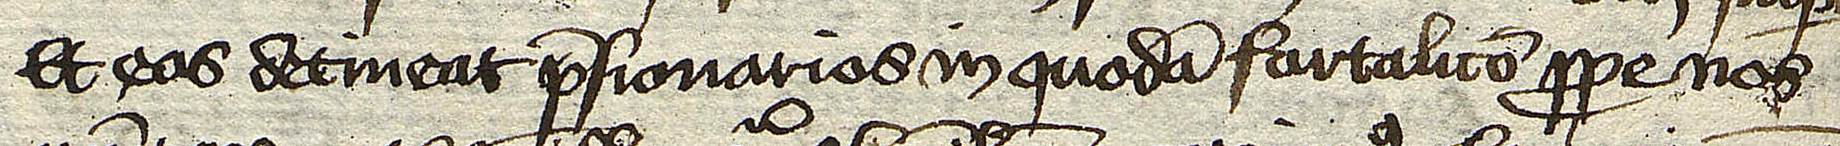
Et eos detineat p*ſionarios in quoda* fortali*o p*pe nos
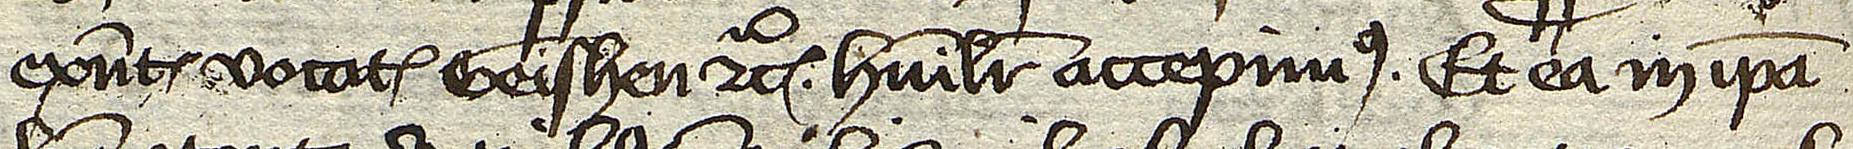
ex*nt* vocat* Geiſhen ec* hu*il*r accepim* . Et ea in ip*a
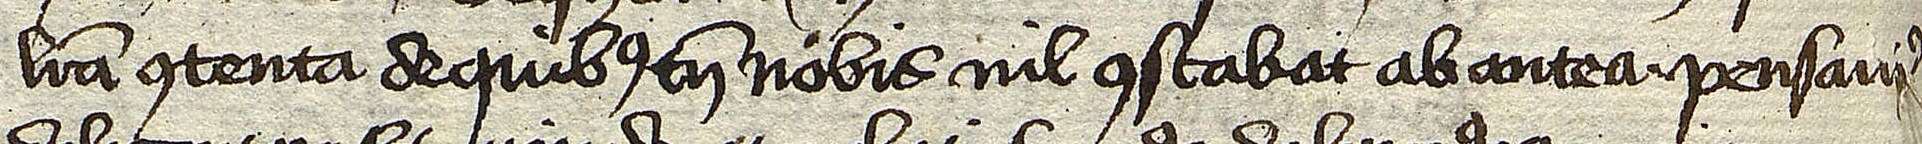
l*ra *tenta de quib* t*n nobis nil *ſtabat ab antea penſari*
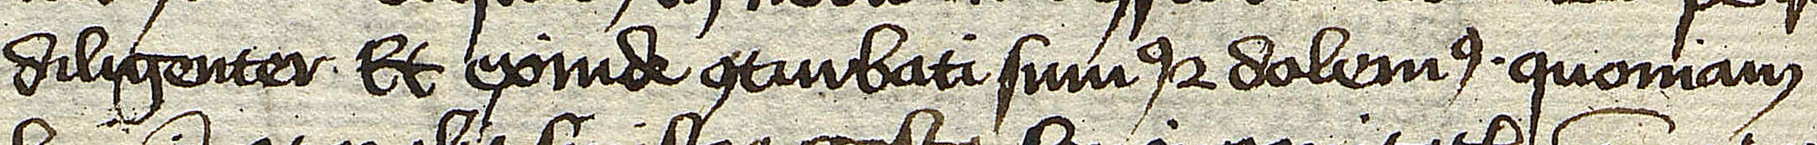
diligenter . Et exinde *turbati ſum* @ dolem* . quoniam
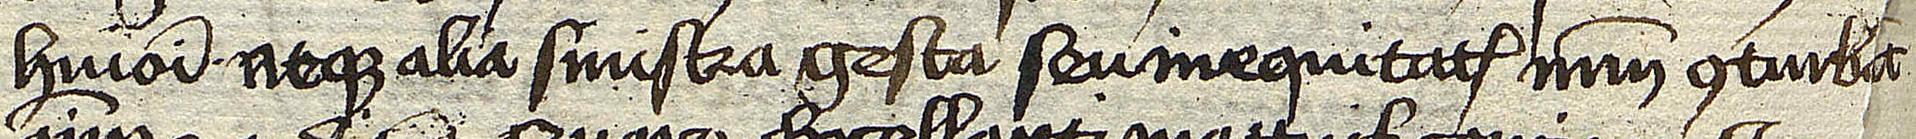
hui*o*i . Neq* alia ſiniſtra geſta ſeu inequitat* n*r*m *turbat*
